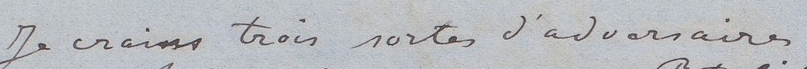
Je crains trois sortes d'adversaires
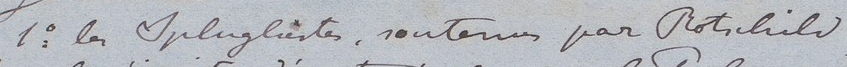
1o les Splughistes, soutenus par Rotschild,
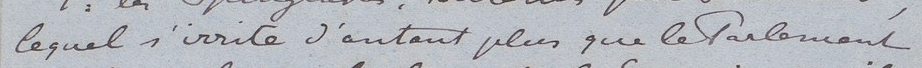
lequel s'irrite d'autant plus que le Parlement
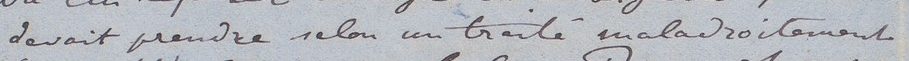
devait prendre selon un traité maladroitement
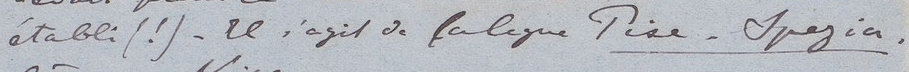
établi (!) – Il s'agit de la ligne Pise–Spezia,
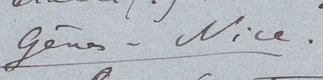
Gênes–Nice.
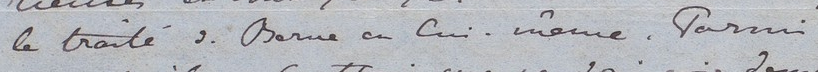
le traîté de Berne en lui-même. Parmi
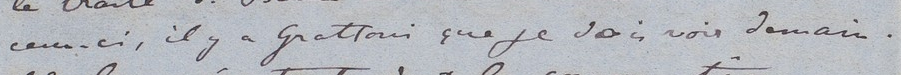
ceux-ci, il y a Grattoni que je dois voir demain.
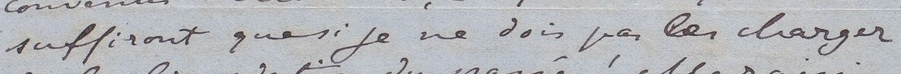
suffiront que si je ne dois pas les charger
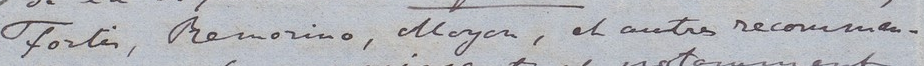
Fortis, Bemorino, Moyen, et autres recomman-
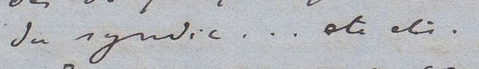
du syndic... etc etc. –
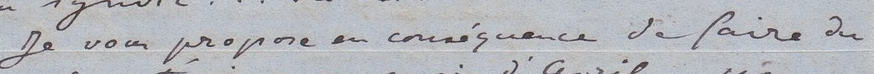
Je vous propose en conséquence de faire du
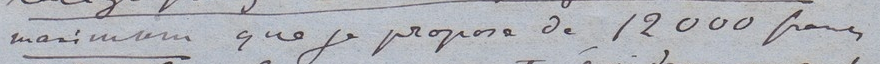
maximum que je propose de 12000 francs
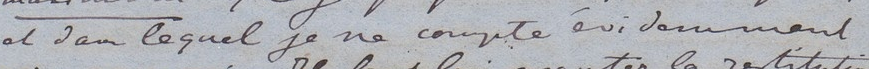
et dans lequel je ne compte évidemment
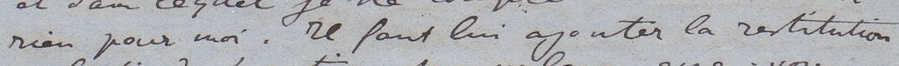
rien pour moi. Il faut lui ajouter la restitution
